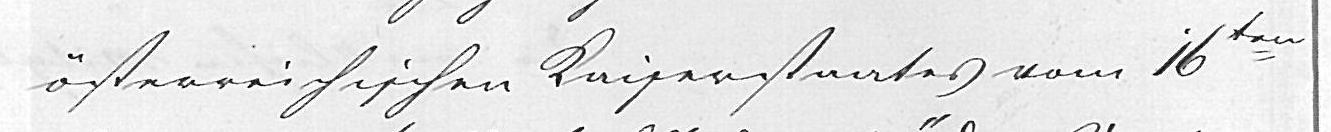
österreichischen Kaiserstaates vom 16ten
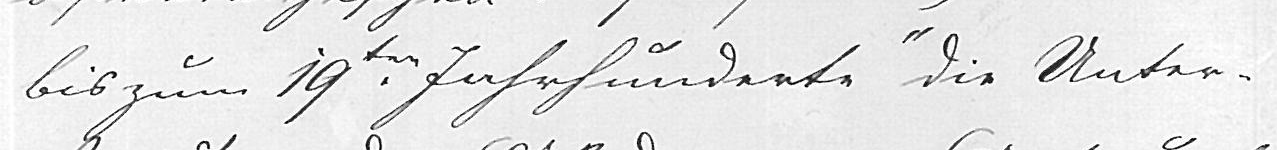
bis zum 19ten Jahrhunderte" die Unter-
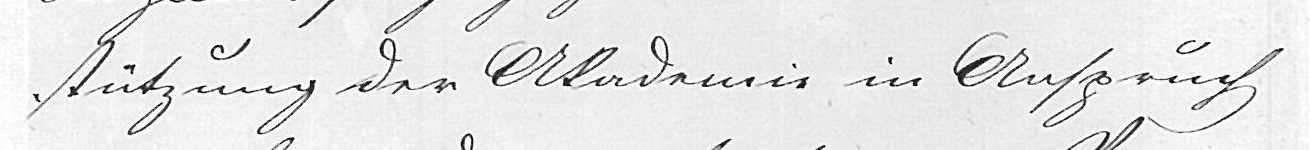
stützung der Akademie in Anspruch
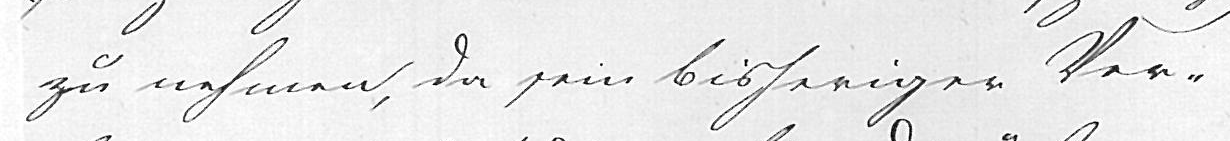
zu nehmen, da sein bisheriger Ver-
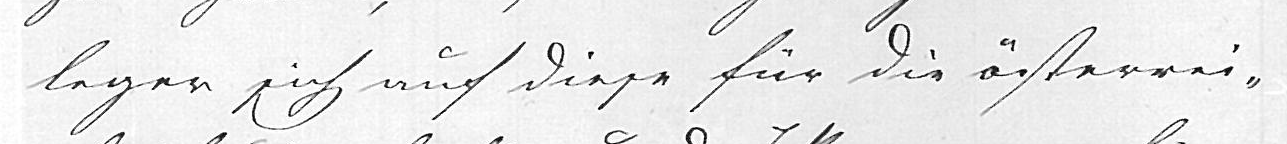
leger sich auf diese für die österrei-
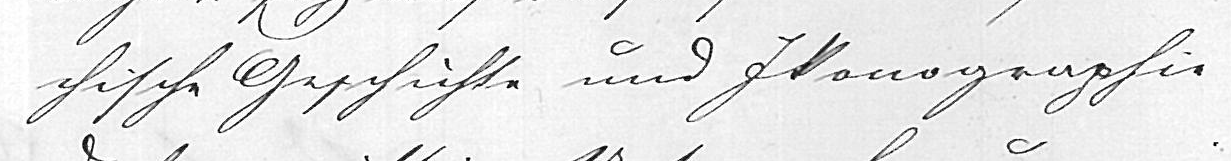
chische Geschichte und Ikonographie
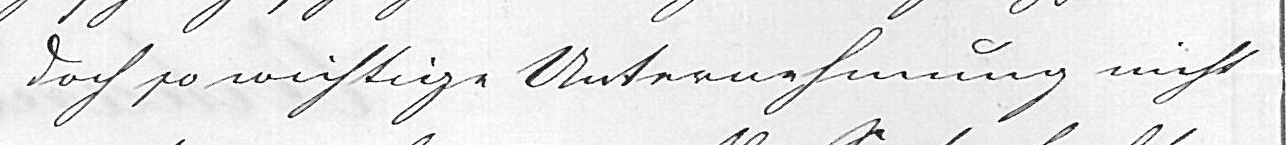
doch so wichtigen Unternehmung nicht
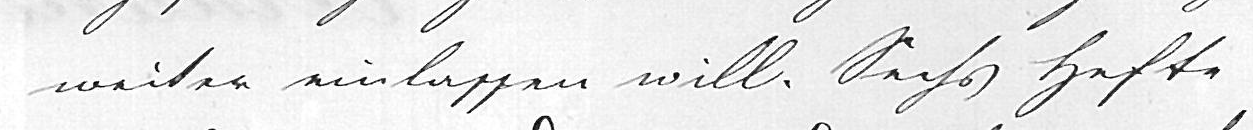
weiter einlassen will. Sechs Hefte
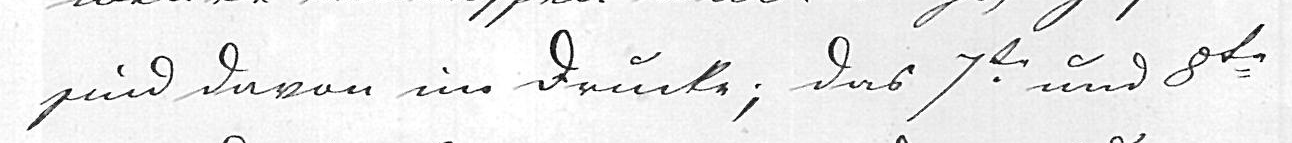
und davon im Druck; das 7te und 8te
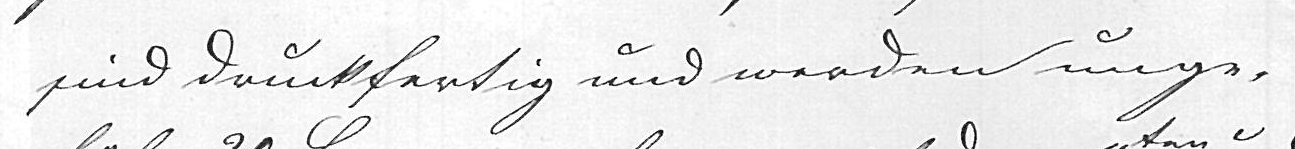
sind druckfertig und werden unge-
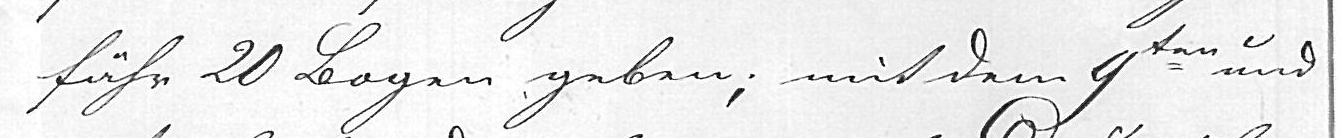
fähr 20 Bogen geben; mit dem 9ten und
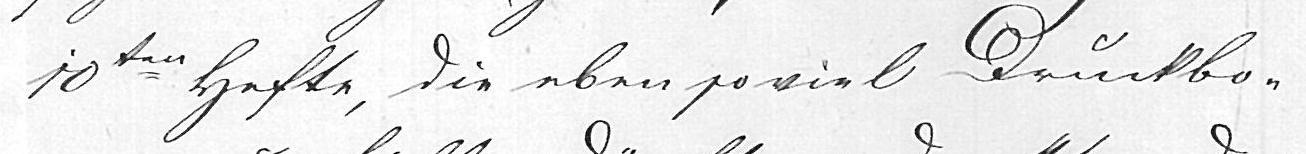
10ten Hefte, die eben soviel Druckbo-
